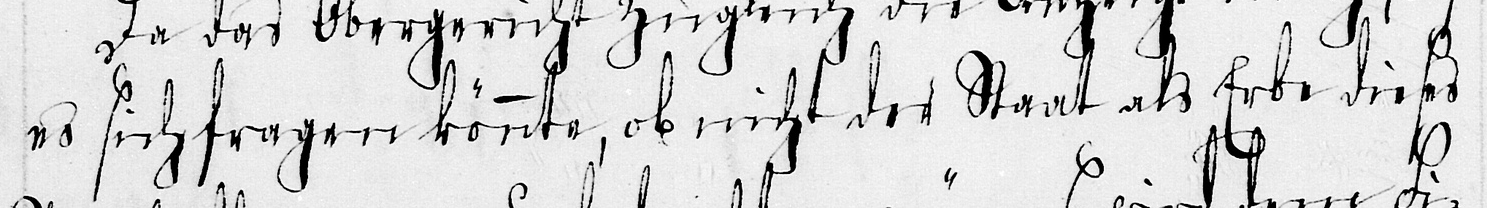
es sich fragen könnte, ob nicht der Saat als Erbe dieses
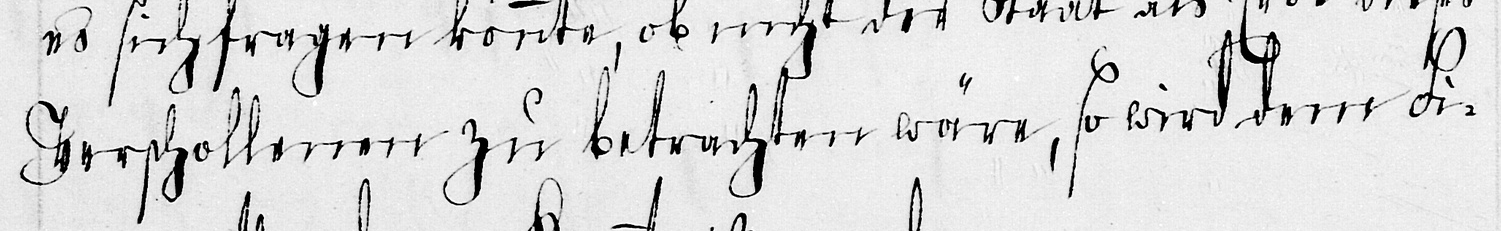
Verschollenen zu betrachten wäre, so wird dem Fi¬
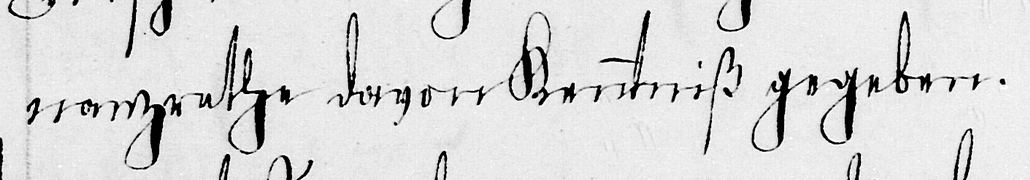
nanzrathe davon Kenntniß gegeben.
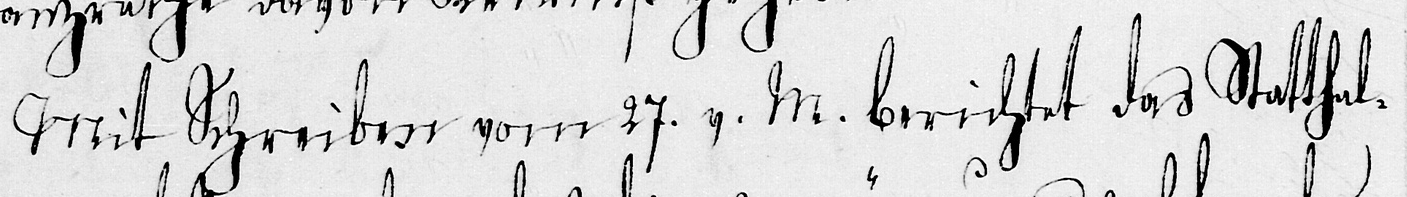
Mit Schreiben vom 27. v. M. berichtet das Statthal¬
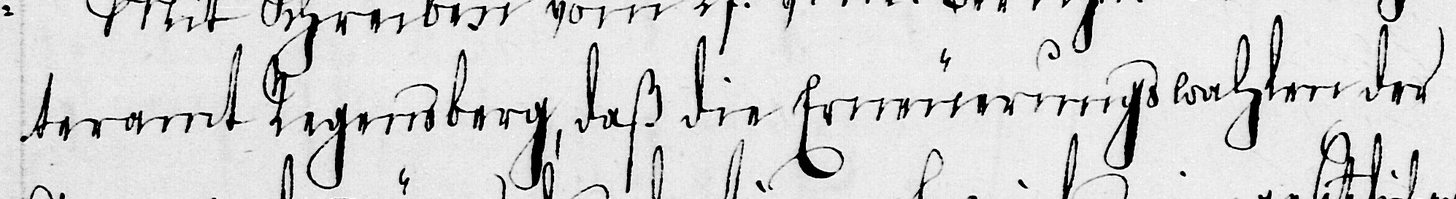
teramt Regensberg, daß die Erneuerungswahlen der
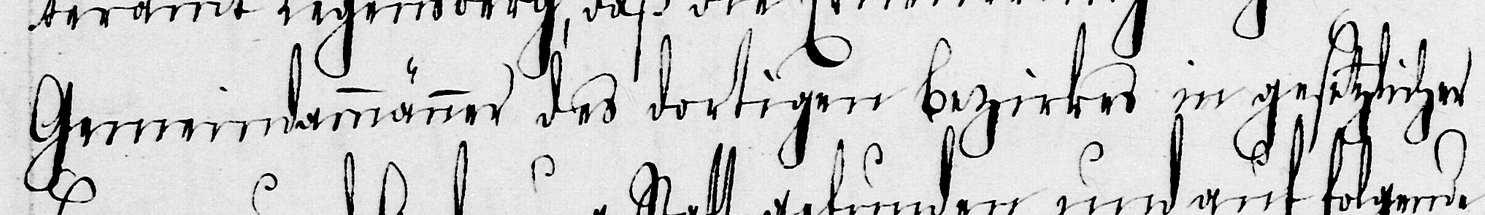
Gemeindammänner des dortigen Bezirkes in gesetzlicher
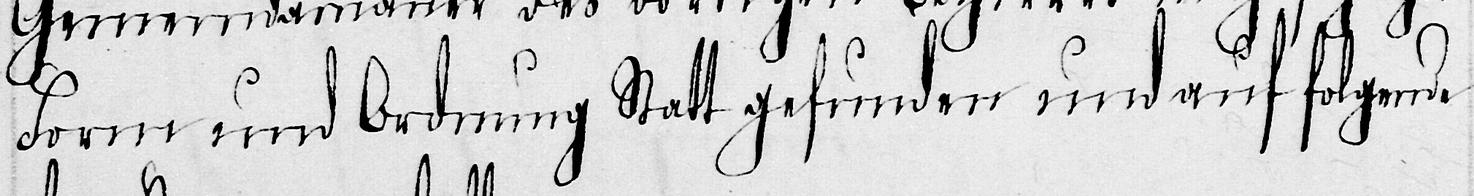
Form und Ordnung Statt gefunden und auf folgende
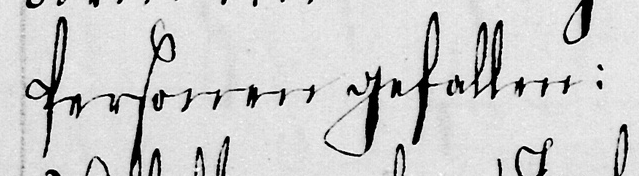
Personen gefallen:
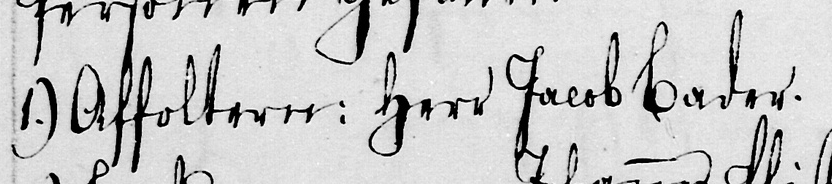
1.) Affoltern: Herr Jacob Bader.
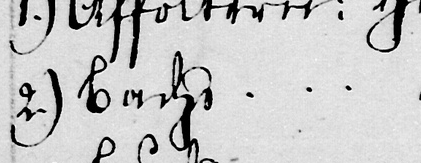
2.) Bachs “ J¬
